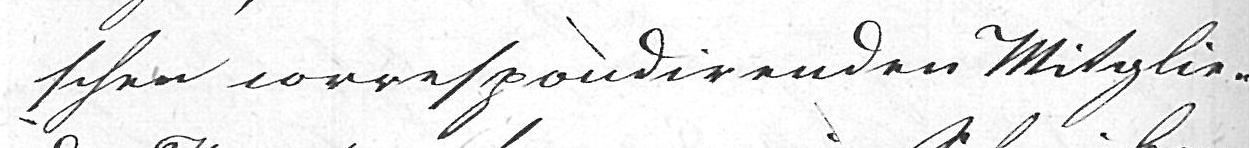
schen correspondirenden Mitglie-
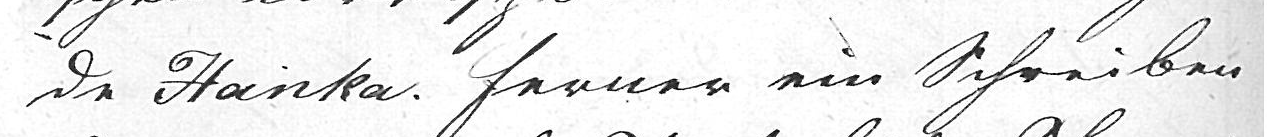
de Hanka. Ferner ein Schreiben
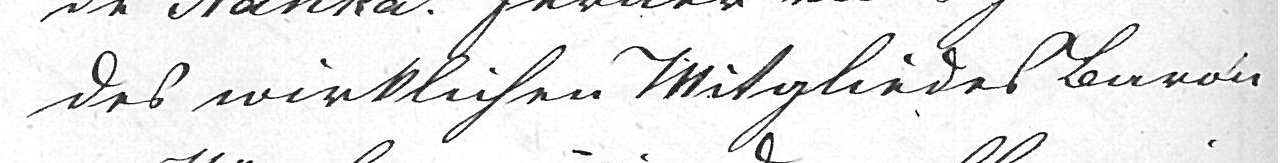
des wirklichen Mitgliederes Baron
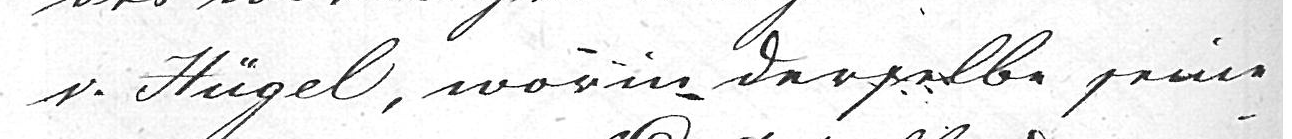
v. Hügel, worin derselbe seine
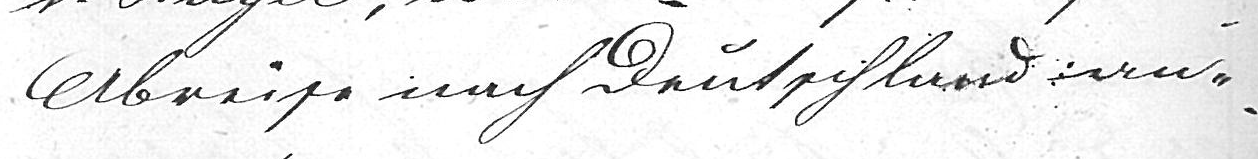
Abreise nach Deutschland an-
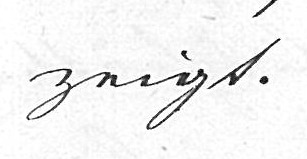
zeigt.
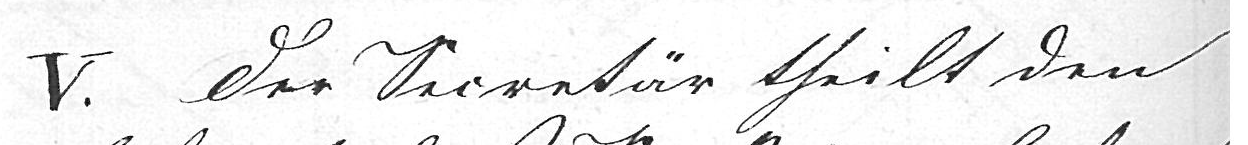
V. Der Secretär theilt den
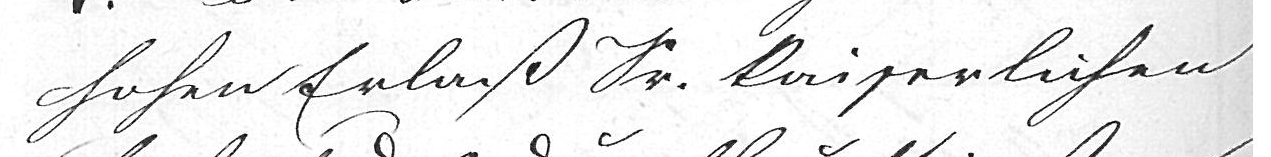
hohen Erlaß Sr. Kaiserlichen
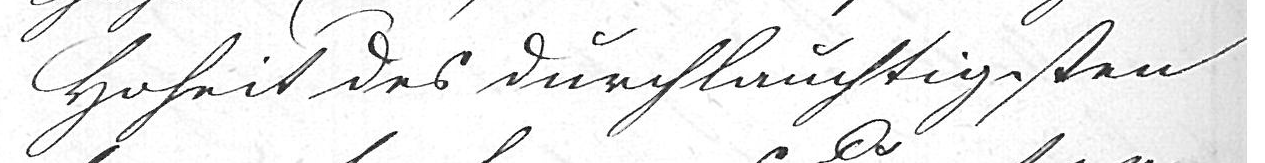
Hoheit des durchlauchtigsten
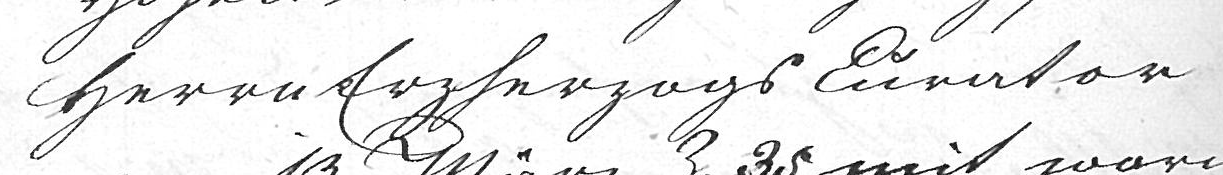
Herrn Erzherzogs Curator
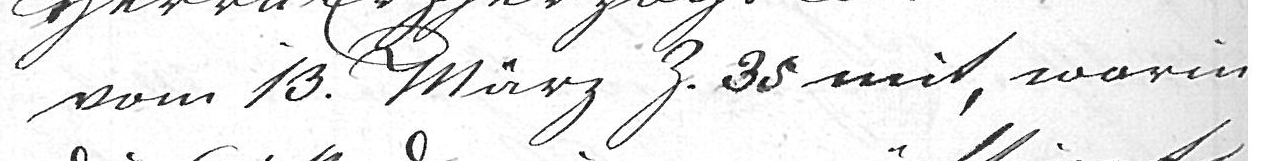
vom 13. März, Z. 35 mit, worin
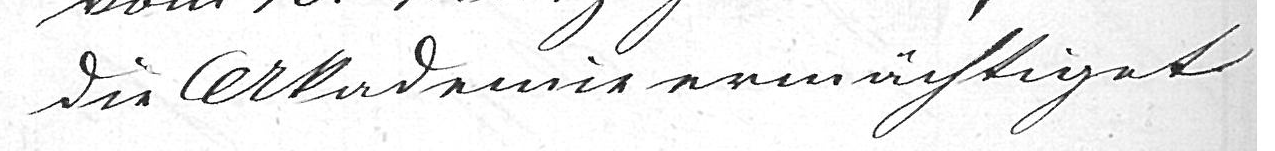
die Akademie ermächtiget
